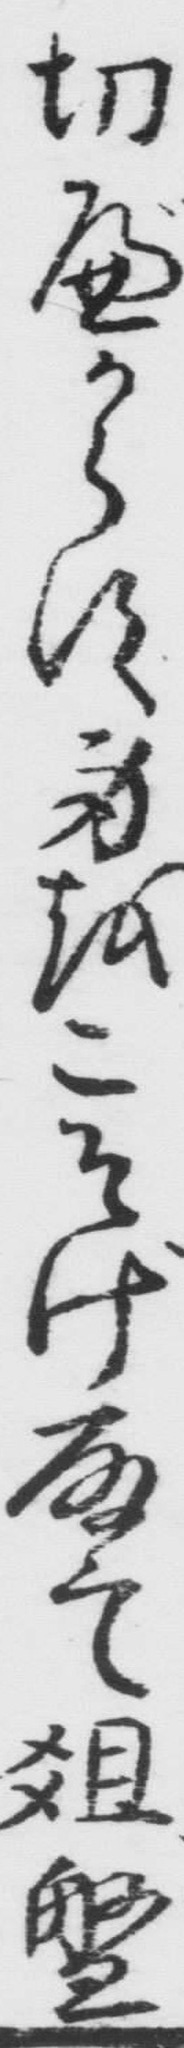切べからす身をこそげ取て俎堅
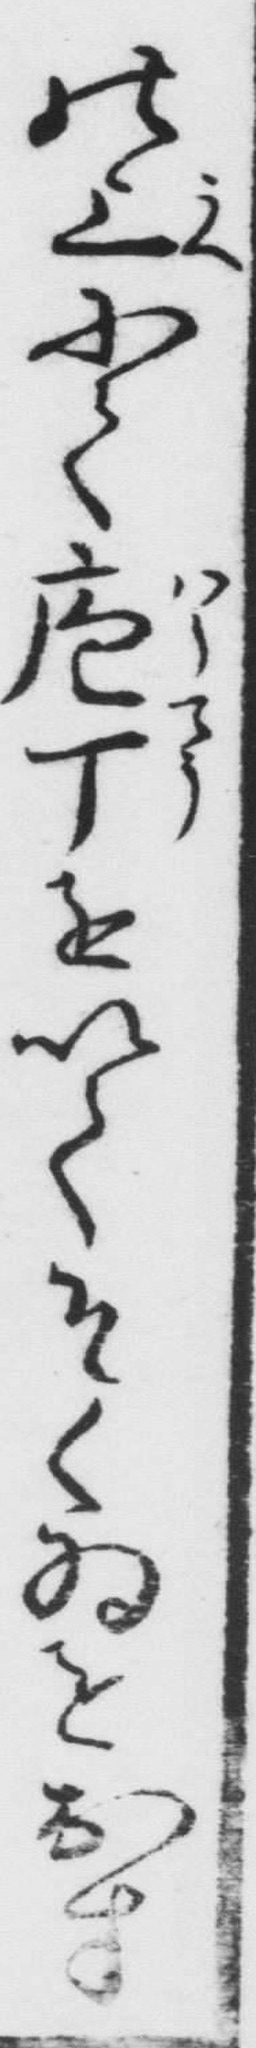の上にて庖丁を以てそくゐをおす
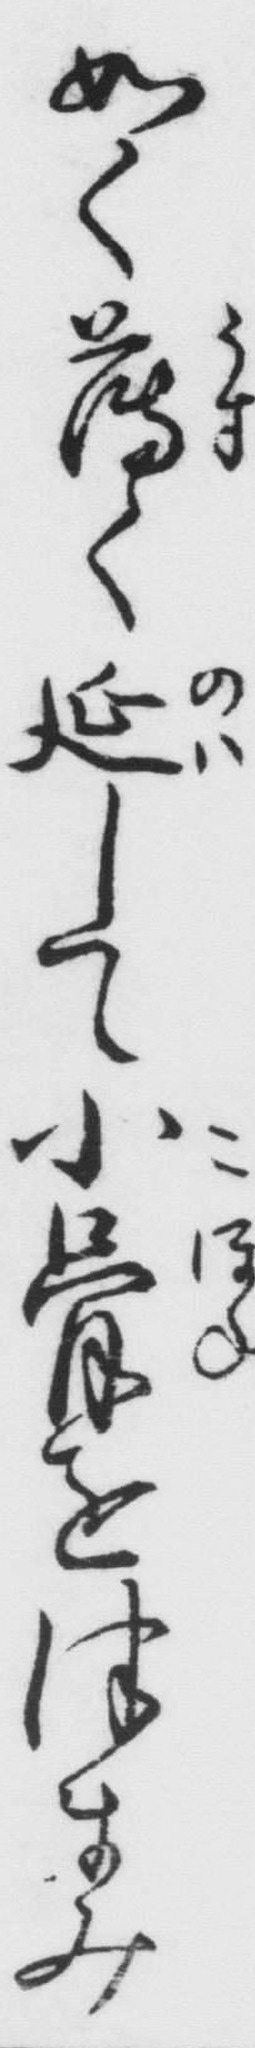如く薄く延して小骨をつまみ
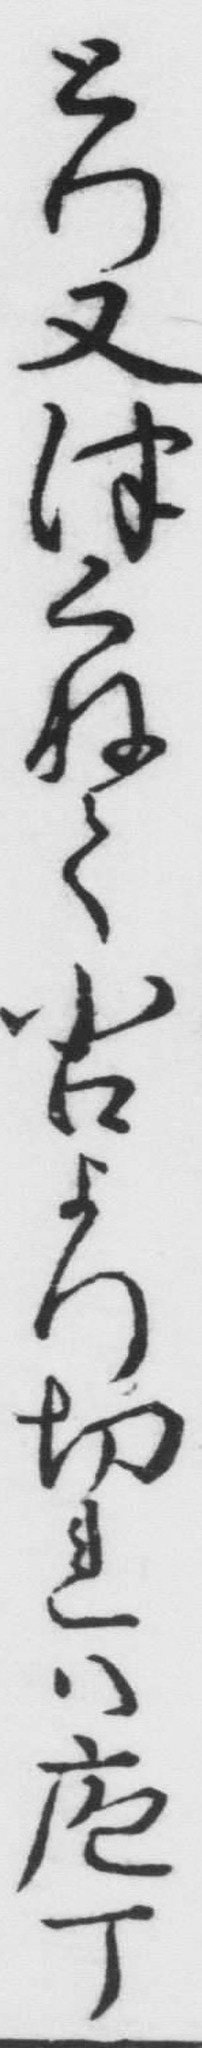とり又つくねて小口より切れは庖丁
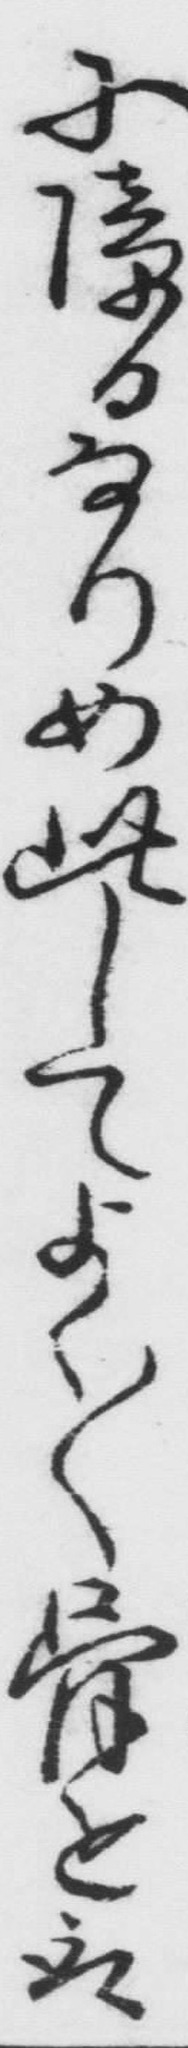に障るなり如此してよく〳〵骨を取
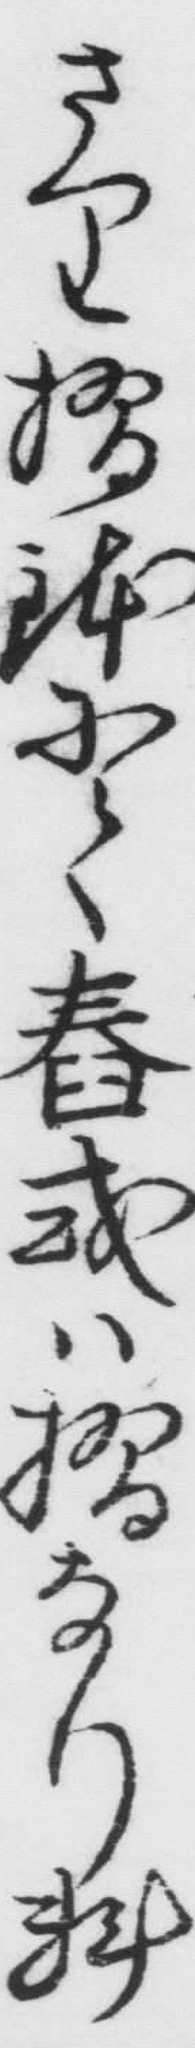さり摺鉢にて舂或は摺なり料
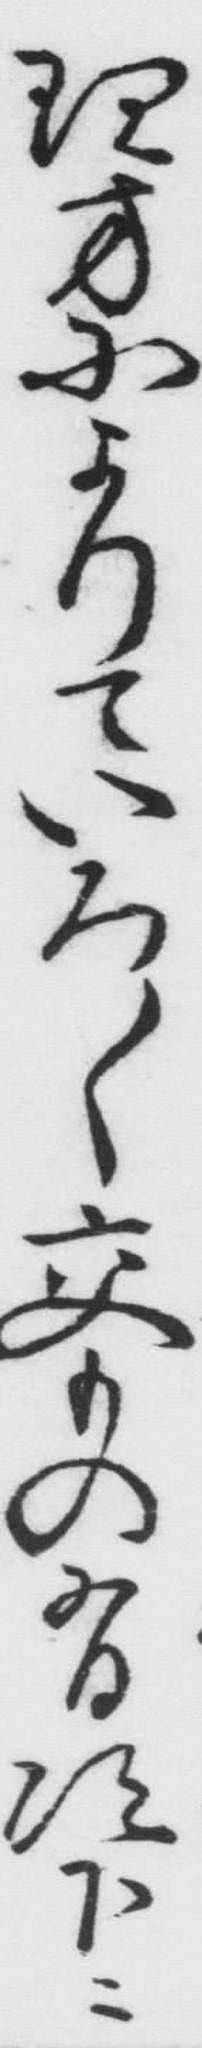理方によりていろ〳〵交もの有後下に
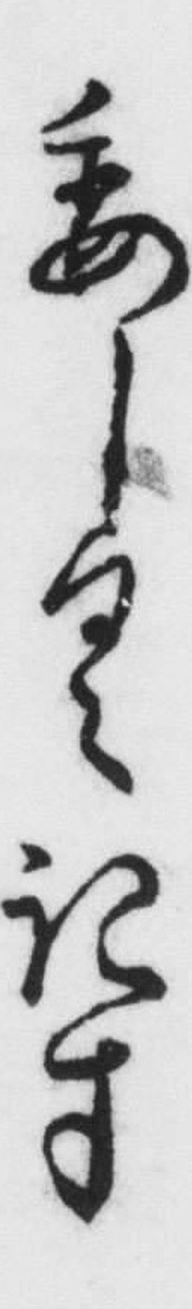委しく記す

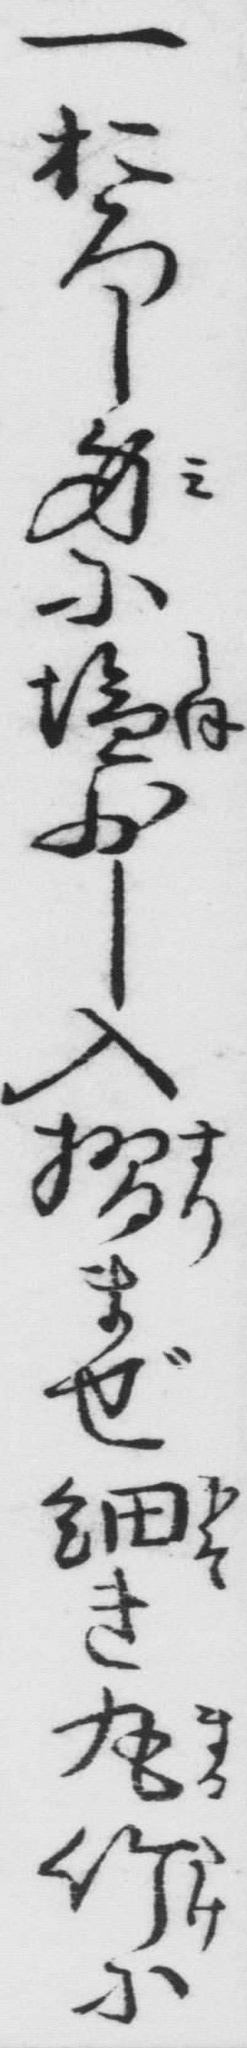一おろし身に塩少し入摺まぜ細き丸竹に
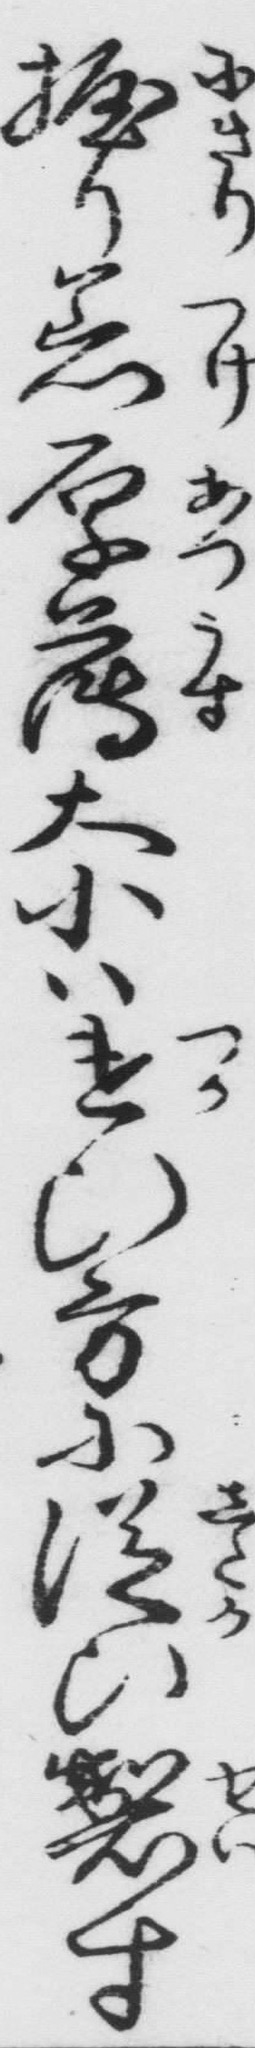握り着厚薄大小は遣ひ方に従ひ製す
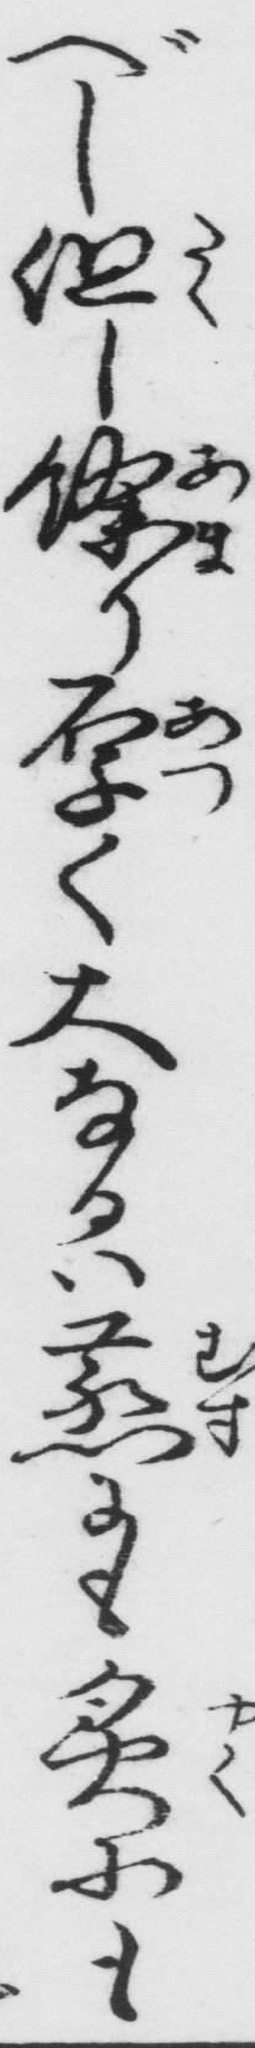べし但し餘り厚く大なるは蒸にも炙にも
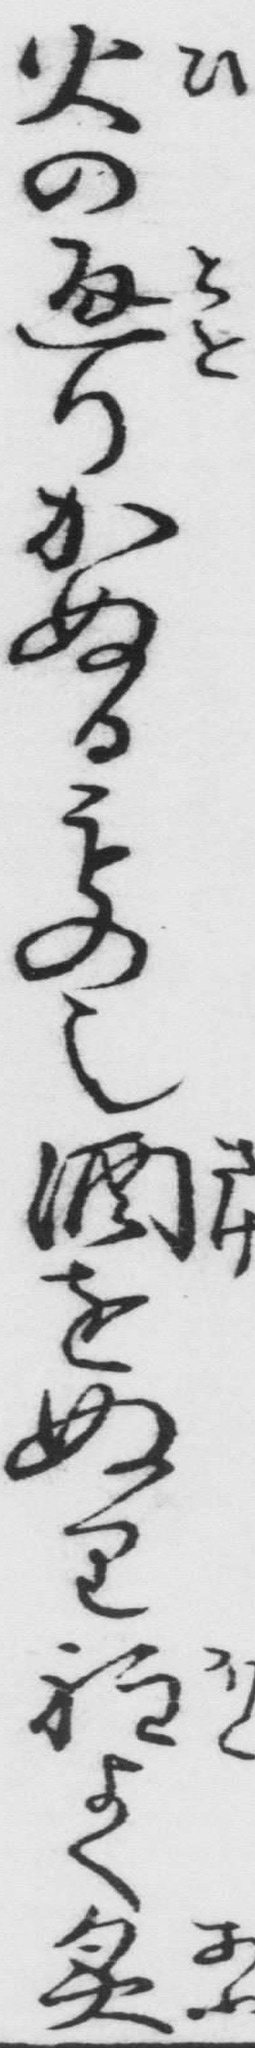火の通りかぬるもの也酒をぬり程よく炙
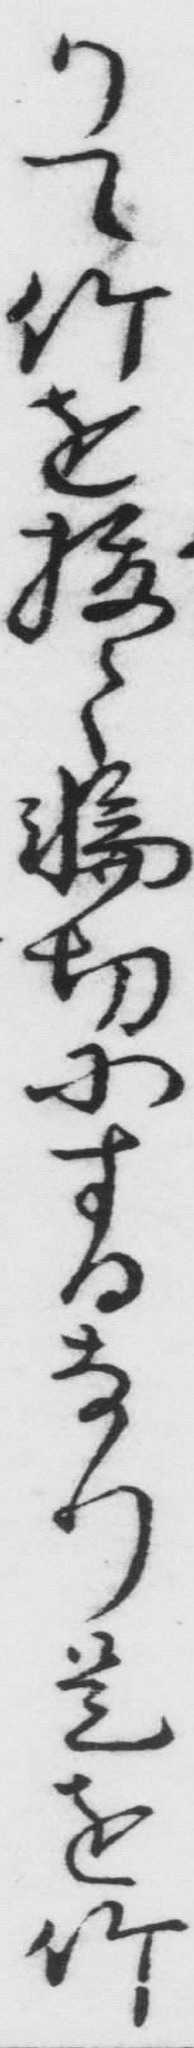りて竹を抜て輪切にするなり是を竹
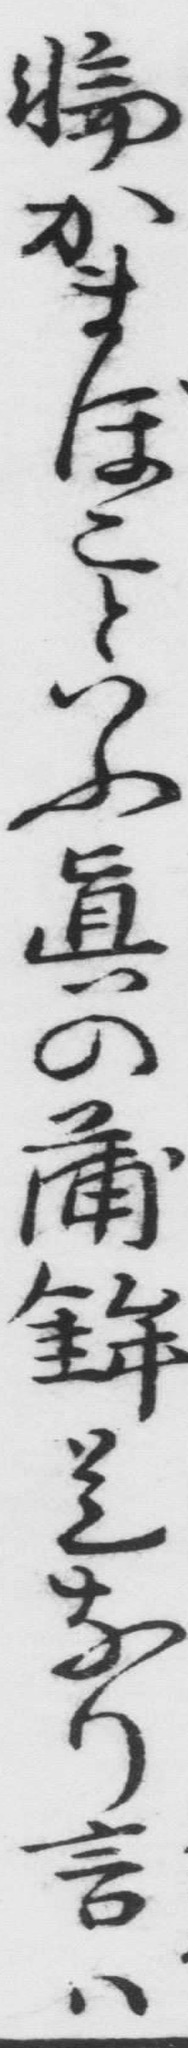輪かまぼこといふ眞の蒲鉾是なり言は
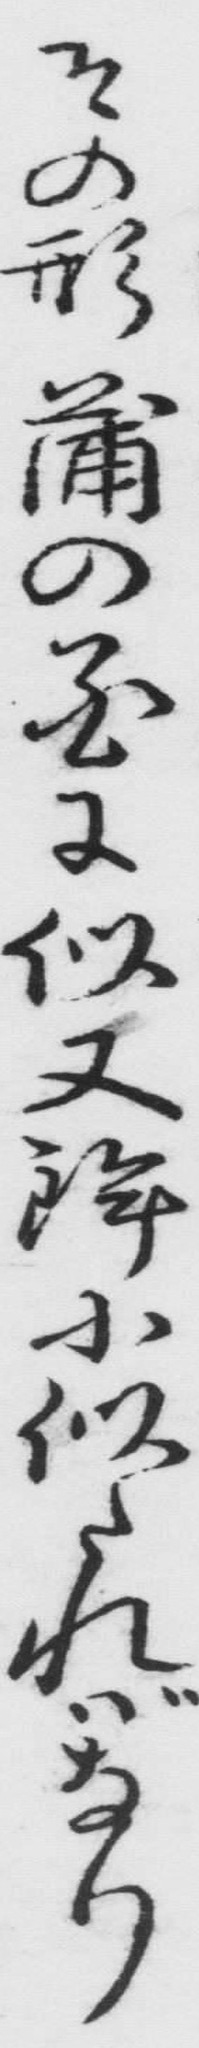その形蒲の花に似又鉾に似たればなり
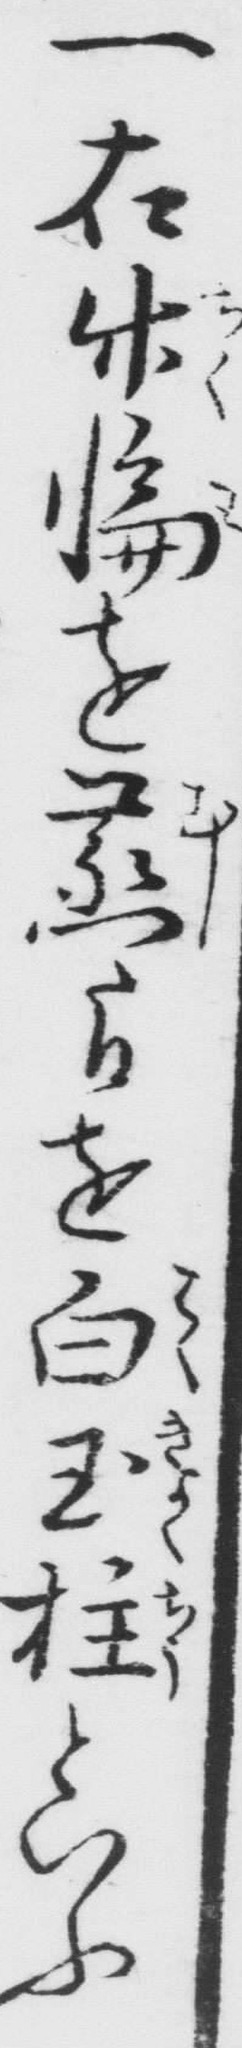一右竹輪を蒸たるを白玉柱といふ
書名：海鰻百珍
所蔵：大阪府立大学学術情報センター 国文学研究資料館
